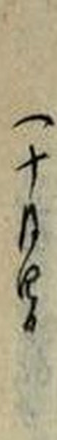一十月四日
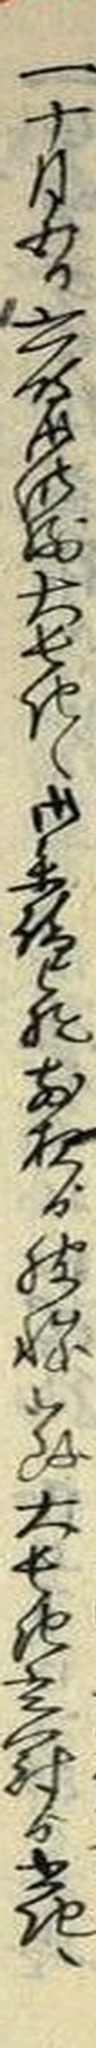一十月五日六時御供揃大長院へ御参詣被遊前夜ゟ服穢御改大長院玄冠ゟ書院へ
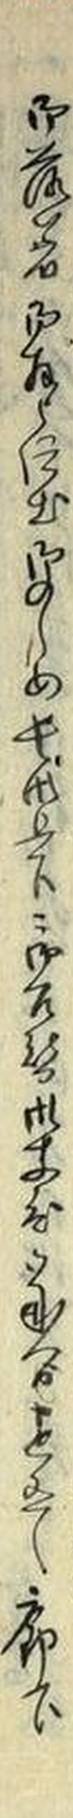御落着御拝被仰出御のしめ長御上下ニ御召替御支度御用人申上有之廊下
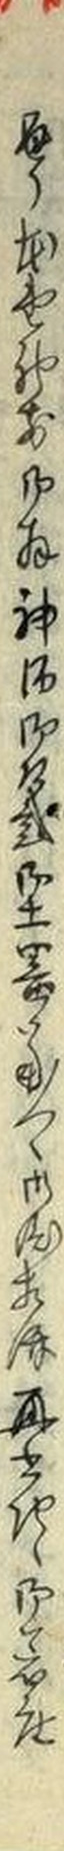通り本堂神前御拝神酒御頂戴御土器御用人御渡相済再書院へ御着座
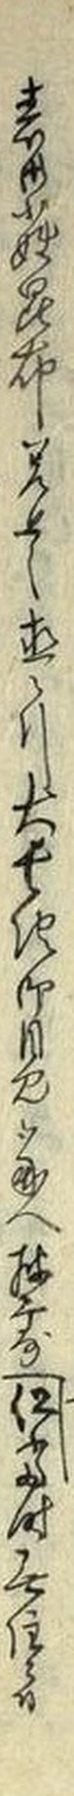表御小姓昆布差上之直ニ引大長院御目見御用人披露「但当時無住ニ付
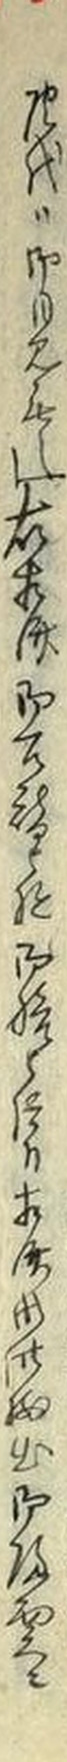院代ハ御目見無之」右相済御召替被遊御膳被仰付相済御供揃出御帰殿ニ
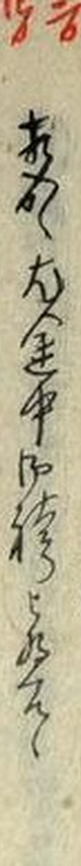相成候尤途中御袴被為召候
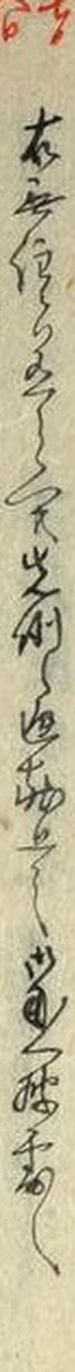右無住ニ而有之候へ共先例之通献上之御用人披露之
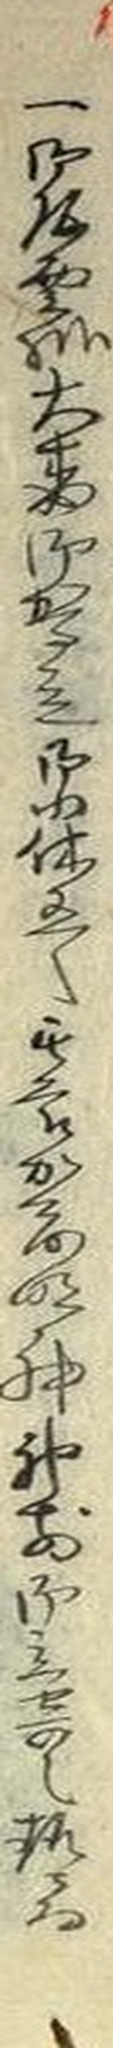一御帰殿掛大森御駕立御小休有之其節加茂明神神前御立寄之趣ニ而
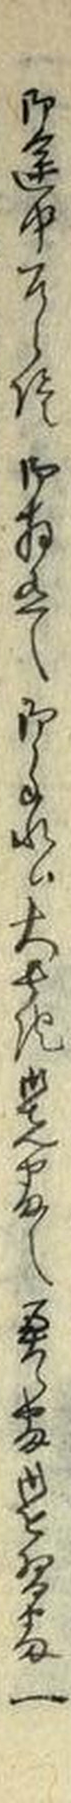御途中召之侭御拝有之御手水ハ大長院御先番之奥之番御近習番一
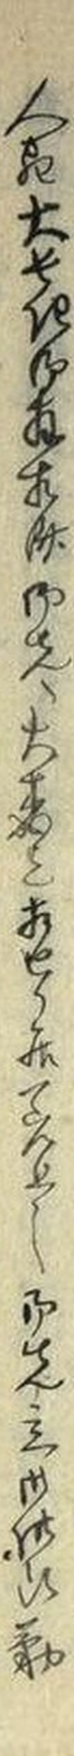人宛大長院御拝相済御先へ大森迄相廻り居差上之御先立御供頭勤
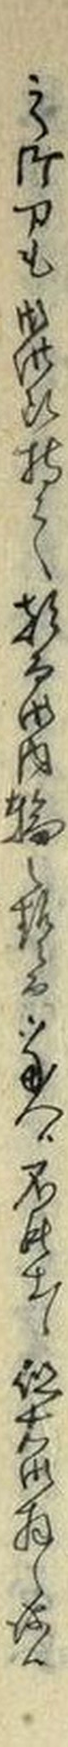之御刀も御供頭持之都而御内輸之趣ニ而御用人ハ不罷出候但右御拝之儀ハ
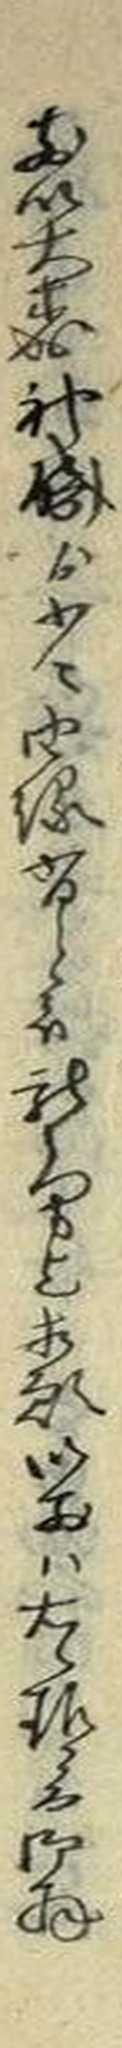前以大森神職ゟ少々由縁有之候ニ付新右衛門方迄相願以前ハ右之趣ニ而御拝

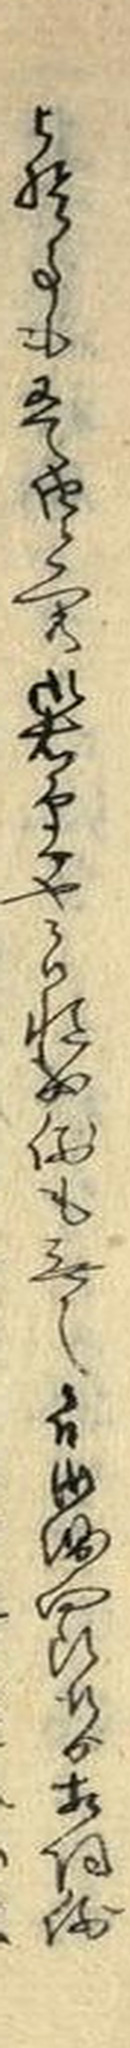被遊候事も有之由ニ候へ共御右筆部やニハ慥成例も無之ニ付御側向頭取ゟ相伺例
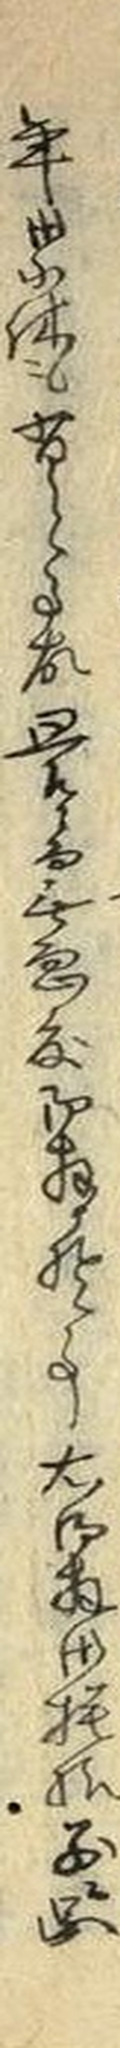年御小休も有之候事故思召ニ而無急度御拝被遊候事右御拝御模様別二図
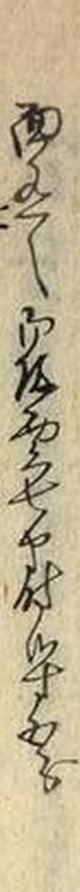面有之御帰殿七半時弐寸五分
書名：少傅日録抄（斉承付側向頭取日記、在国）
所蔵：福井県文書館 Fukui Prefectural Archives
